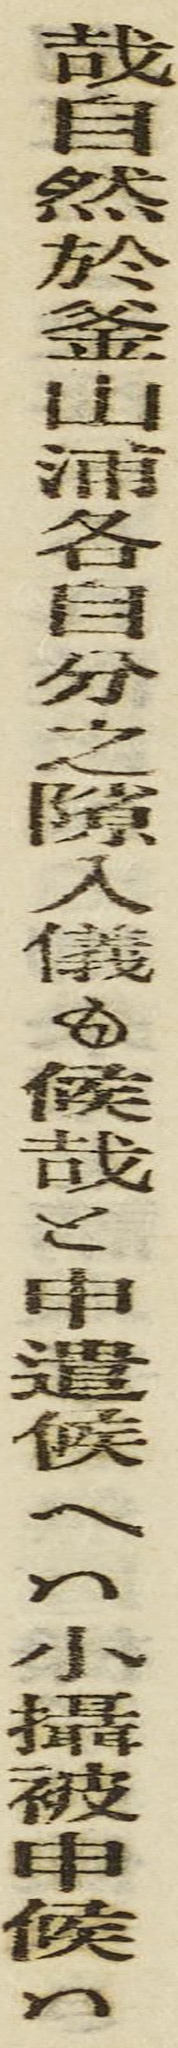哉自然於釜山浦各自分之隙入儀も候哉と申遣候へハ小摂被申候ハ
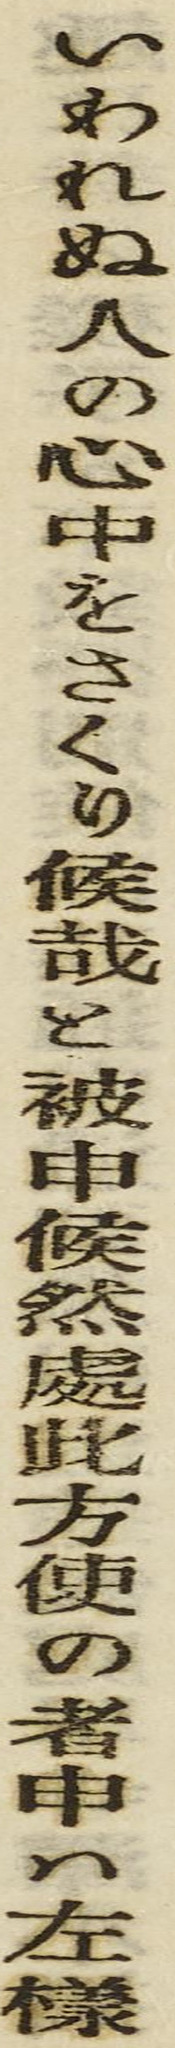いわれぬ人の心中をさくり候哉と被申候然処此方使の者申ハ左様
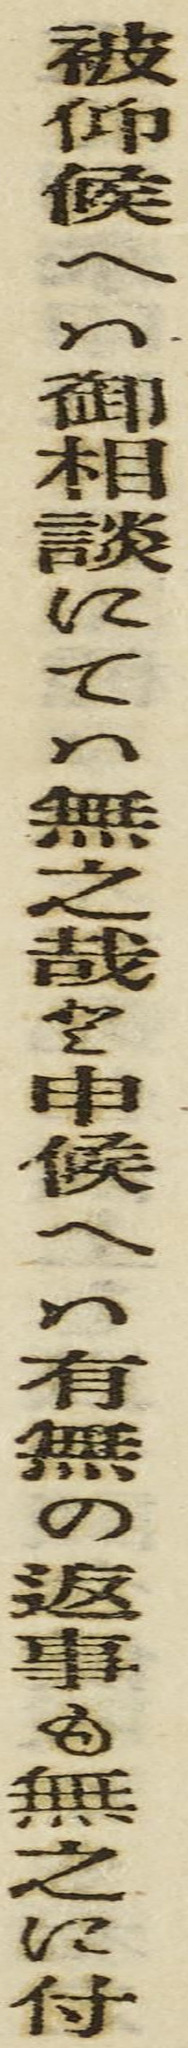被仰候へハ御相談にてハ無之哉と申候へハ有無の返事も無之に付
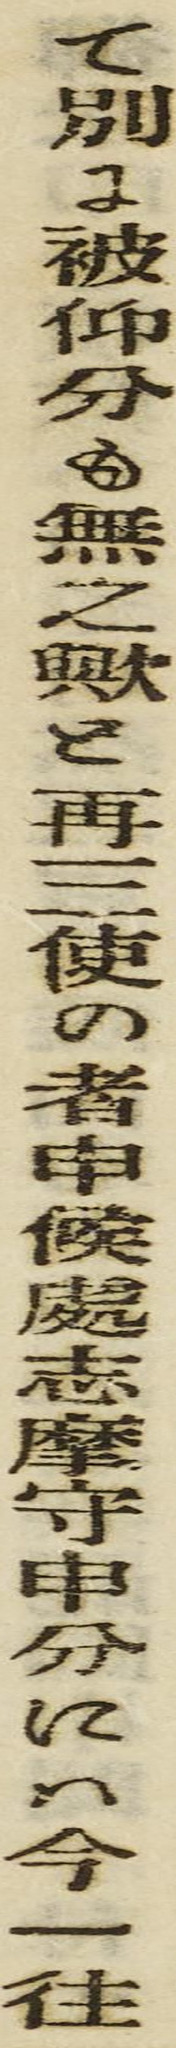て別に被仰分も無之歟と再三使の者申候処志摩守申分にハ今一往

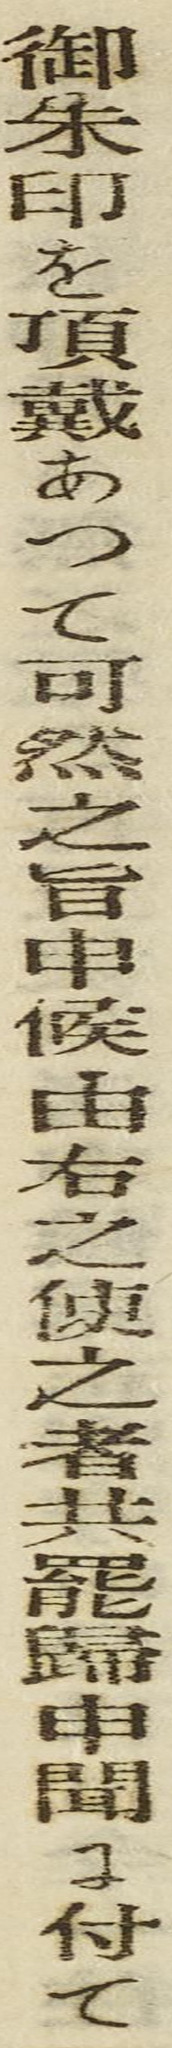御朱印を頂戴あつて可然之旨申候由右之使之者共罷帰申聞に付て
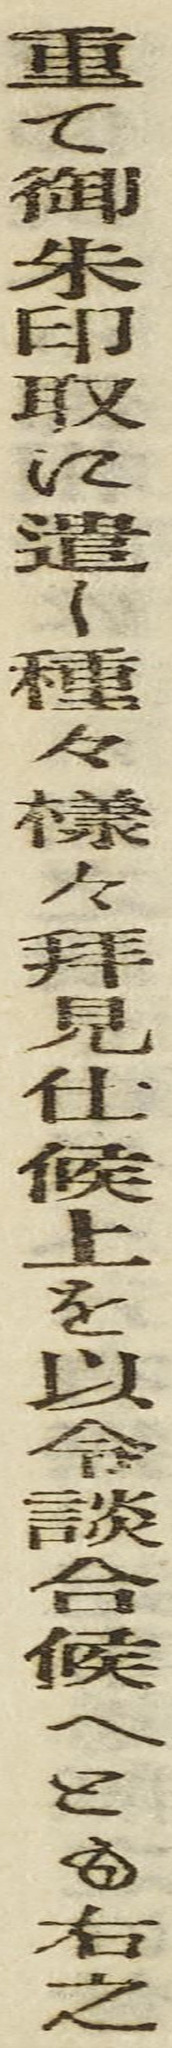重て御朱印取に遣し種々様々拝見仕候上を以令談合候へとも右之
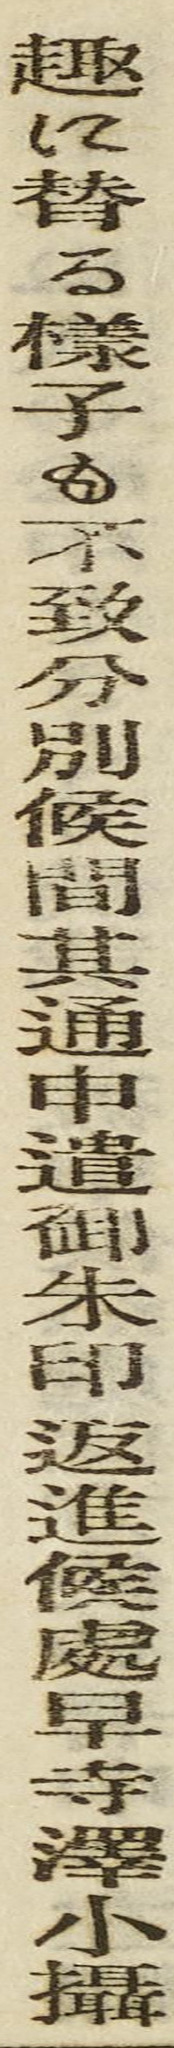趣に替る様子も不致分別候間其通申遣御朱印返進候処早寺沢小摂
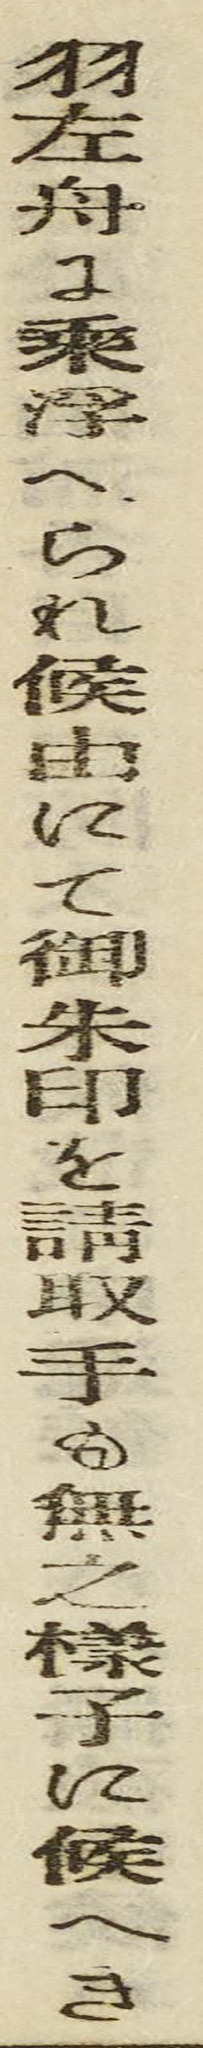羽左舟に乗浮へられ候由にて御朱印を請取手も無之様子に候へき
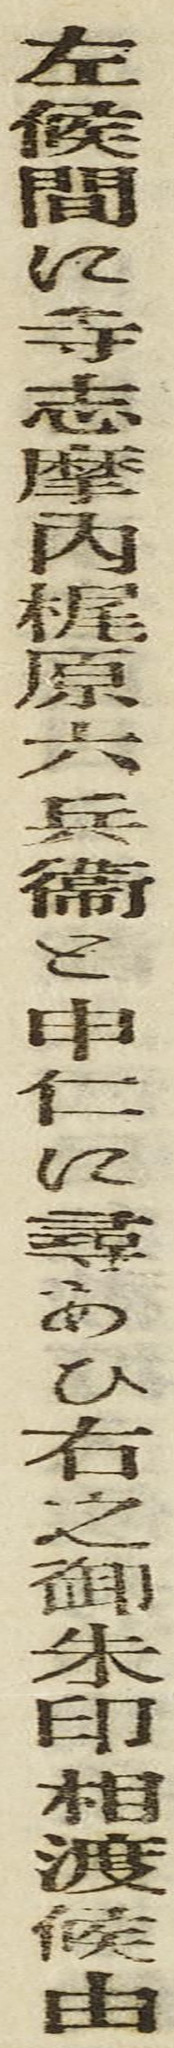左候間に寺志摩内梶原六兵衛と申仁に尋あひ右之御朱印相渡候由
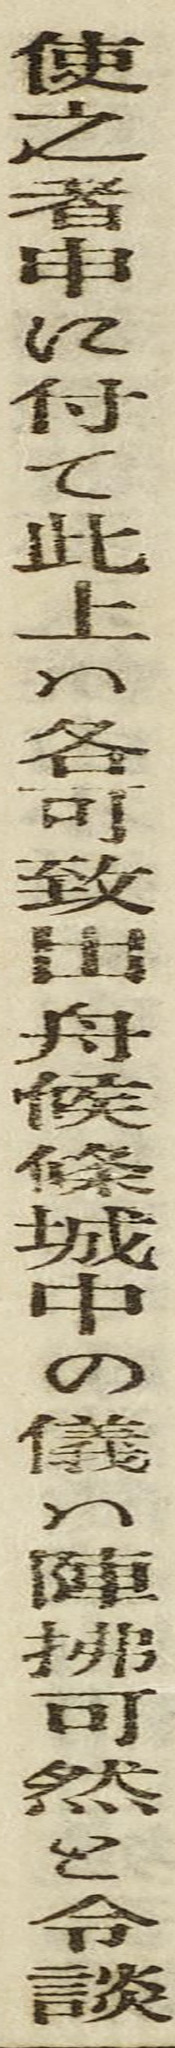使之者申に付て此上ハ各可致出舟候条城中の儀ハ陣払可然と令談
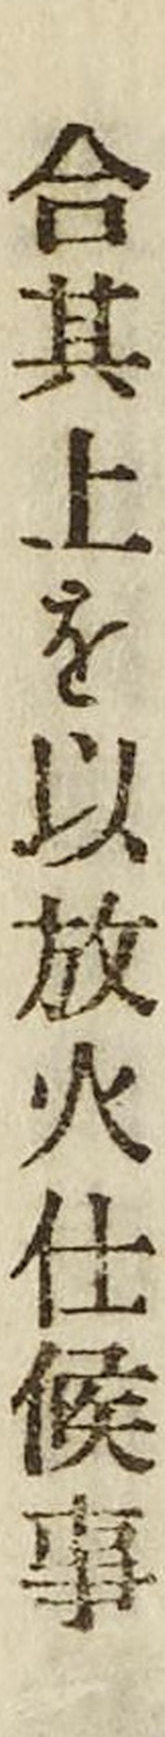合其上を以放火仕候事
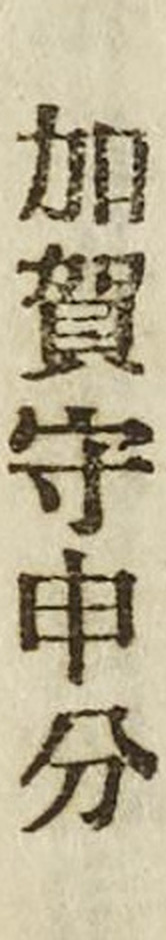加賀守申分
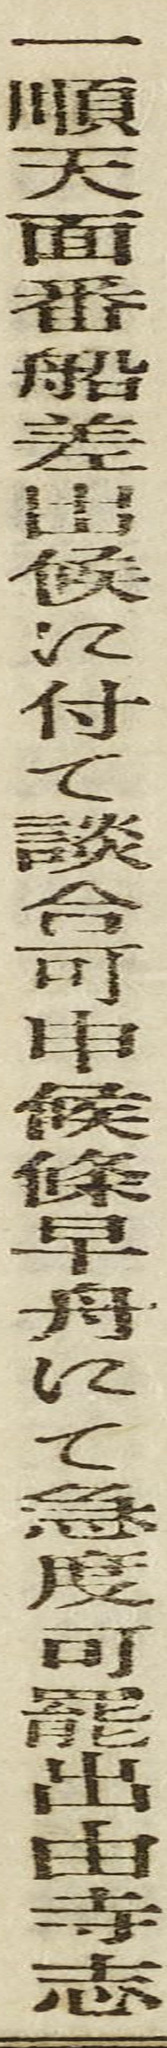一順天面番船差出候に付て談合可申候条早舟にて急度可罷出由寺志
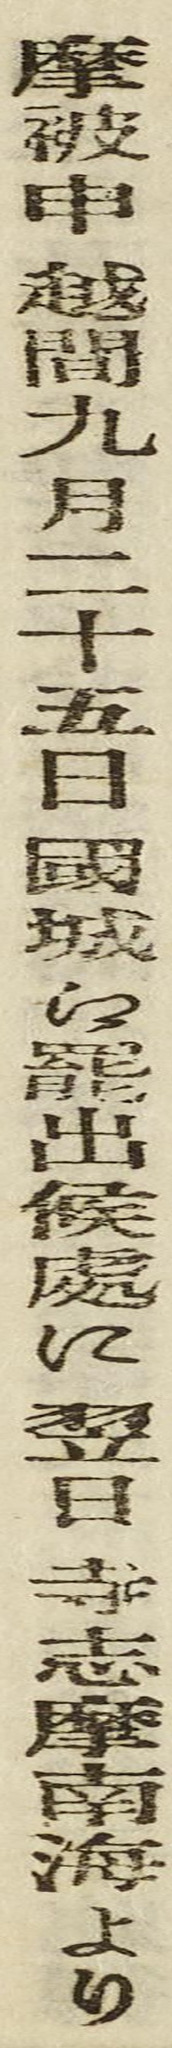摩被申越間九月二十五日国城え罷出候処に翌日寺志摩南海より
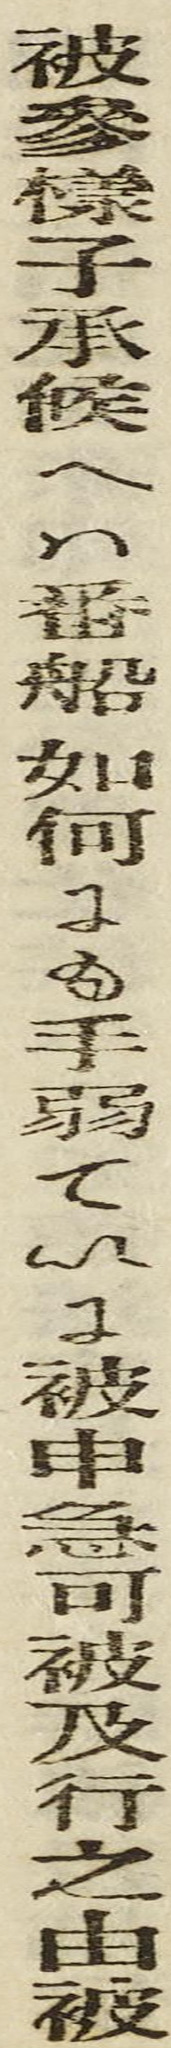被参様子承候へハ番船如何にも手弱ていま被申急可被及行之由被
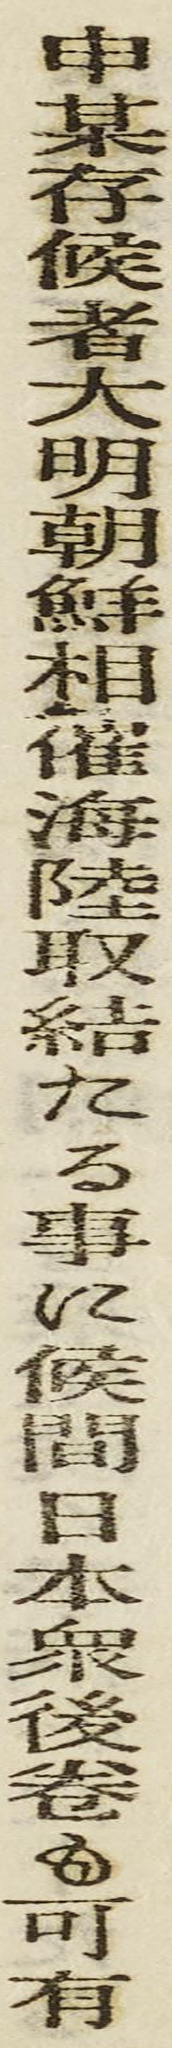申某存候者大明朝鮮相催海陸取結たる事に候間日本衆後巻も可有
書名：史籍集覽　朝鮮陣古文・細井廣澤記・颶風紀事・天明七年將軍宣下次第書　全
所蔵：東京大学地震研究所図書室 Earthquake Research Institute Library, The University of Tokyo, JAPAN
